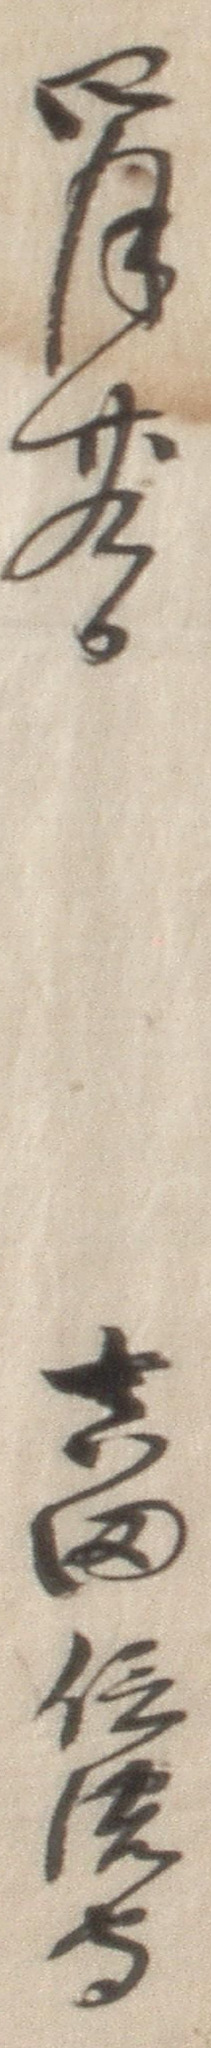四月廿九日真田信濃守
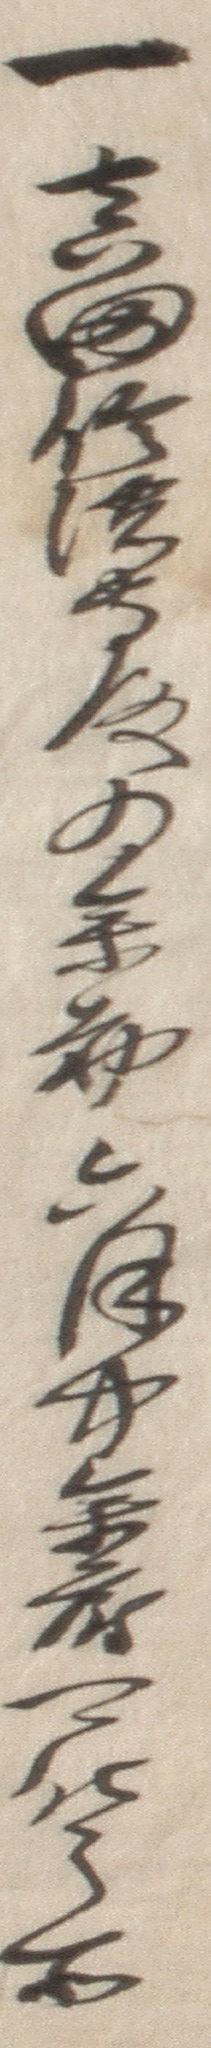一真田信濃守殿為参勤六月中参府可仕候所
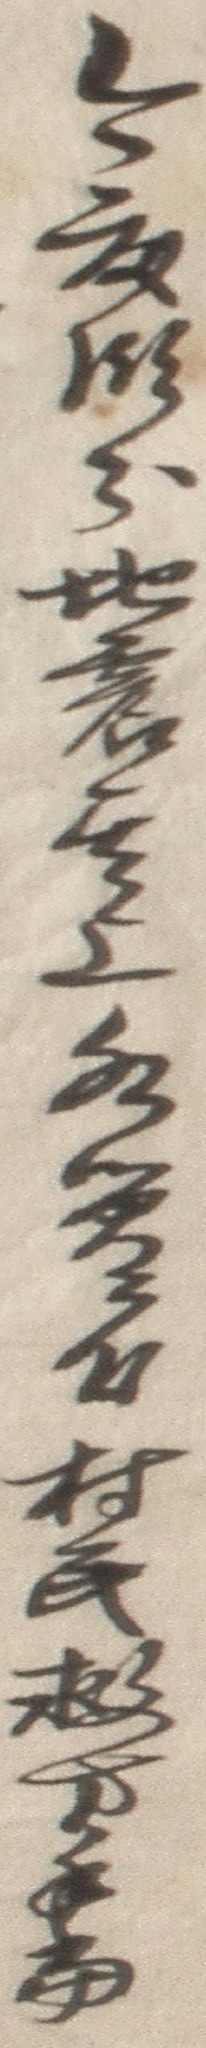今度領分地震其上水災二付村民救方手当
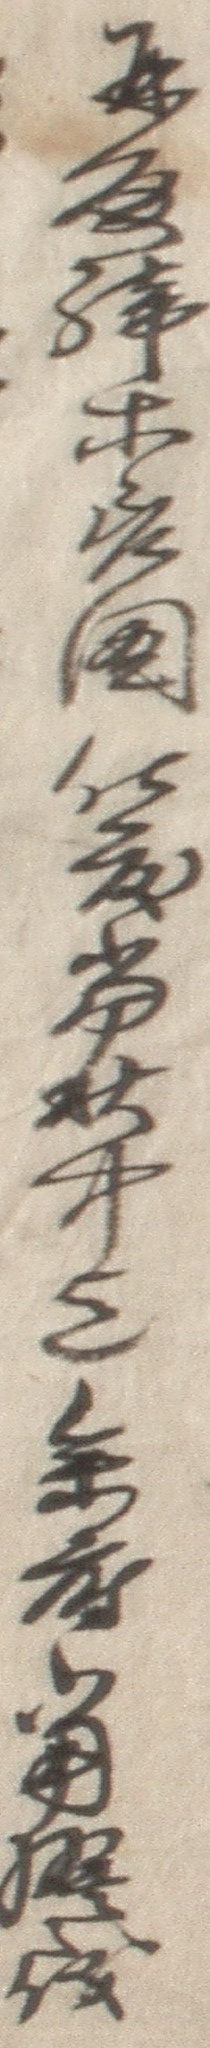并取締等差図仕度当秋中迄参府御用捨？之儀
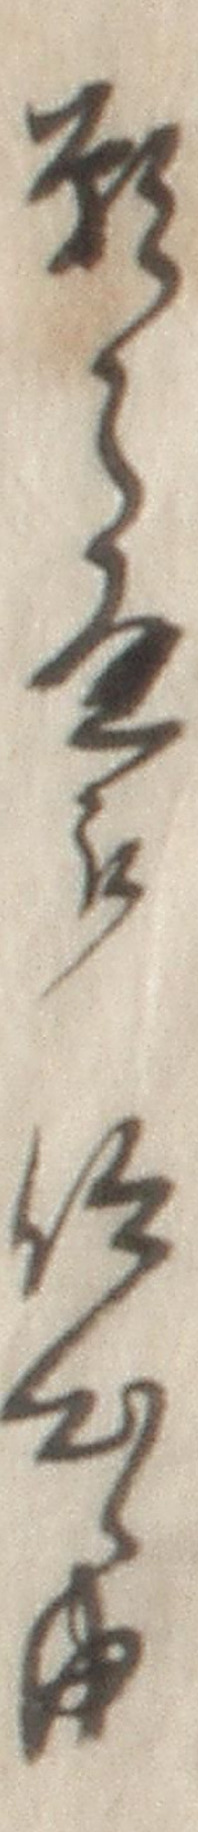願之通被仰出候由
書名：信州地震一件
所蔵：東京大学地震研究所図書室 Earthquake Research Institute Library, The University of Tokyo, JAPAN
